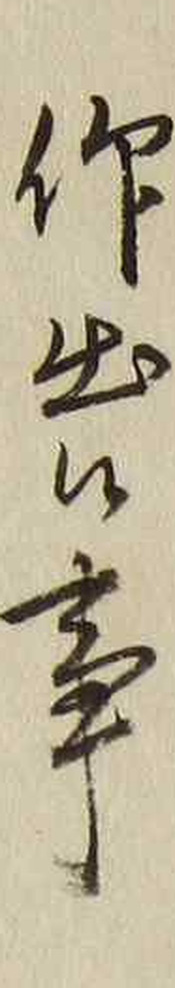仰出候事
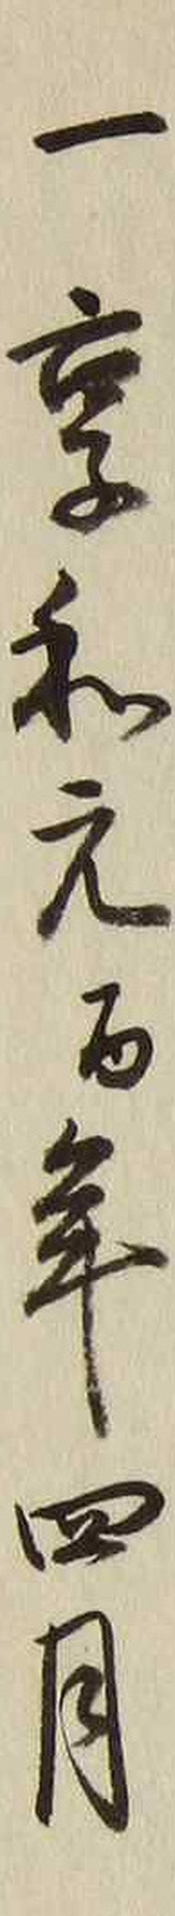一享和元酉年四月
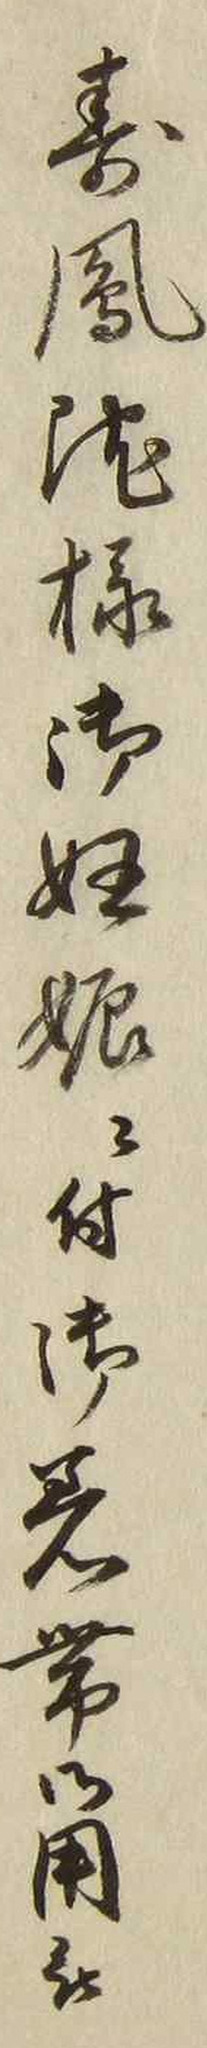寿鳳院様御妊娠に付御着帯御用被

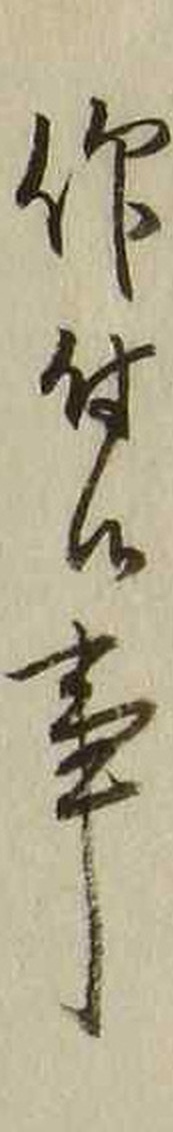仰付候事
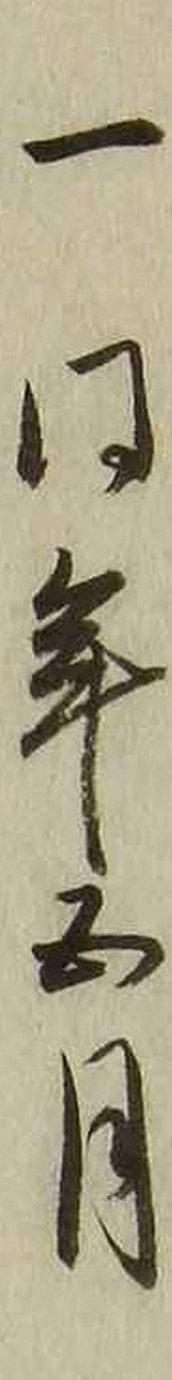一同年五月
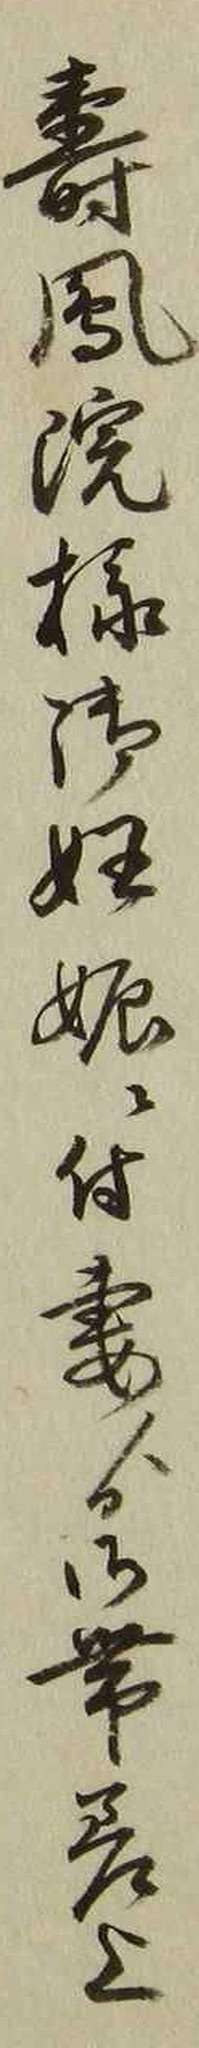寿鳳院様御妊娠に付妻ゟ御帯差上
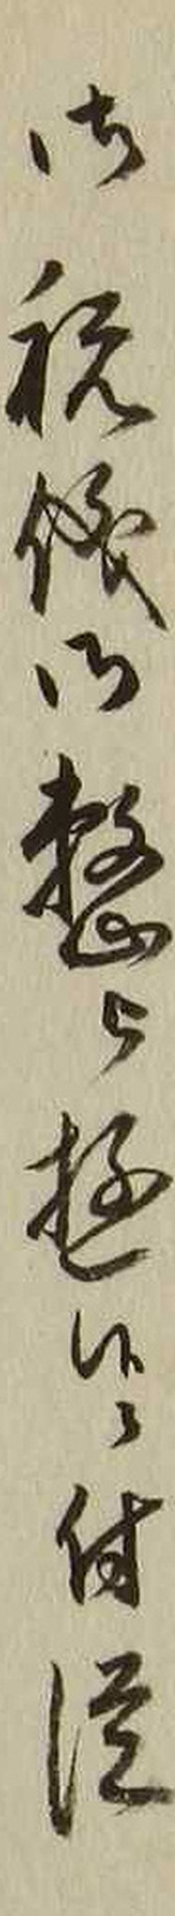御祝儀御整被遊候に付従
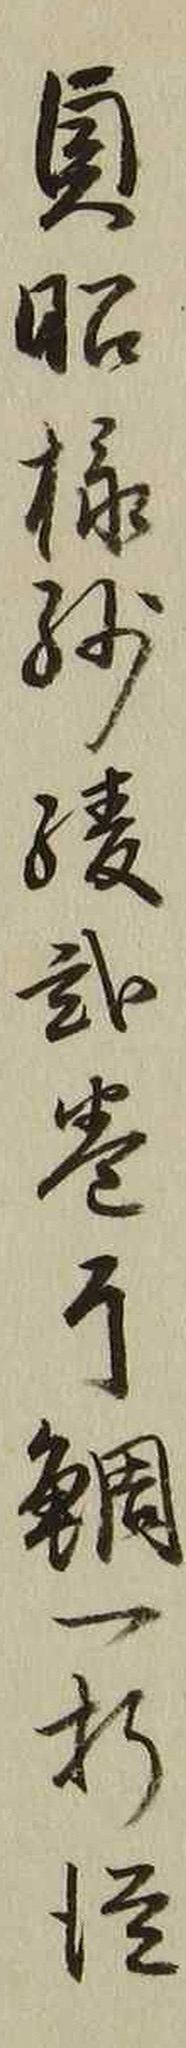貞昭様紗綾弐巻干鯛一折従
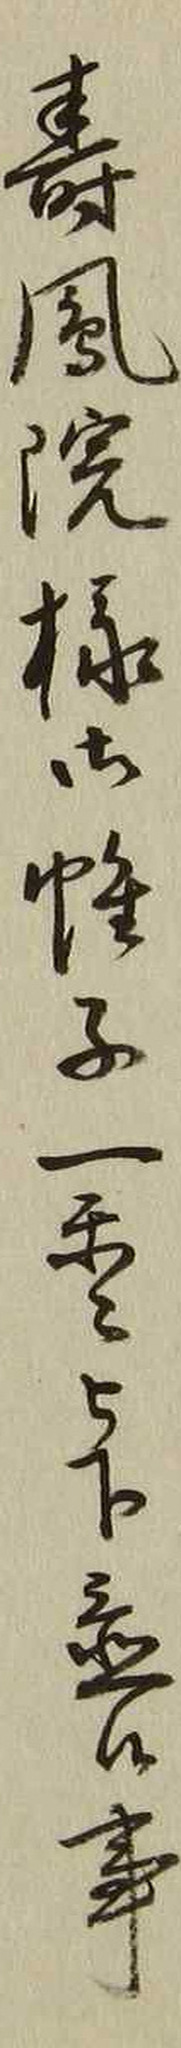寿鳳院様御帷子一重被下置候事
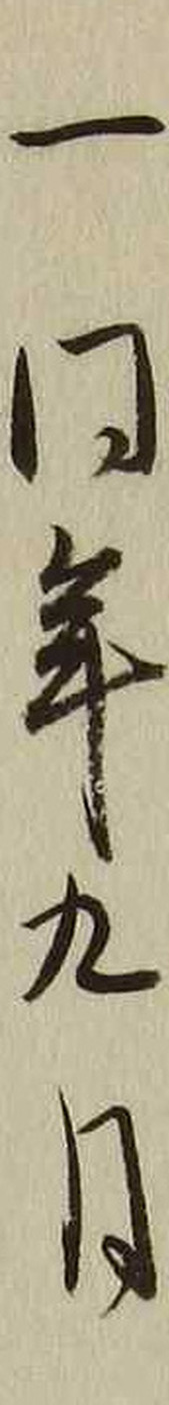一同年九月
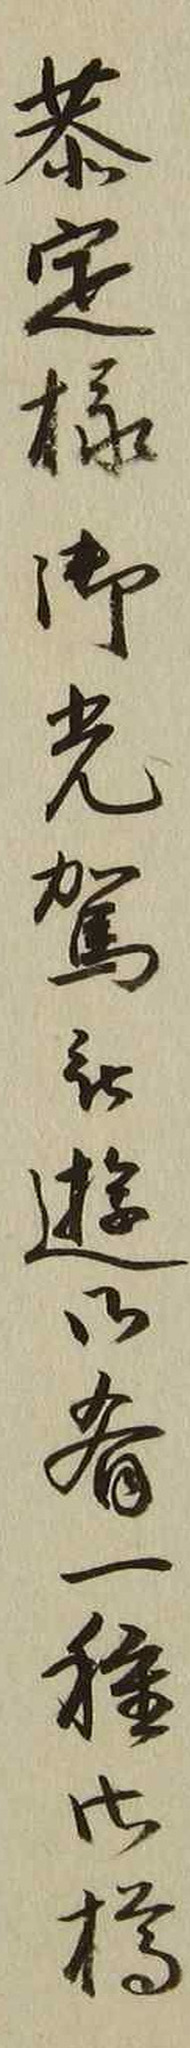恭定様御光駕被遊御肴一種御樽
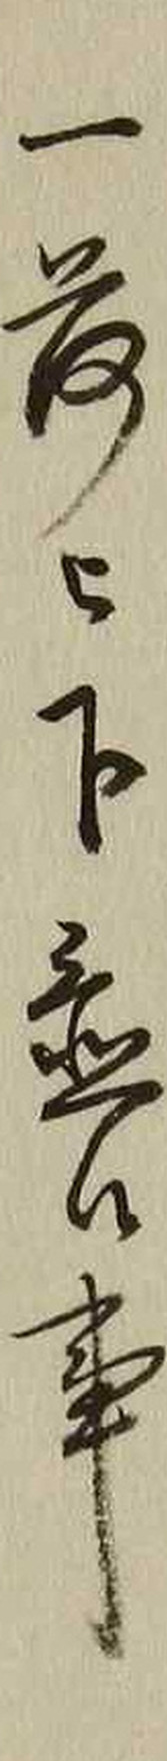一荷被下置候事
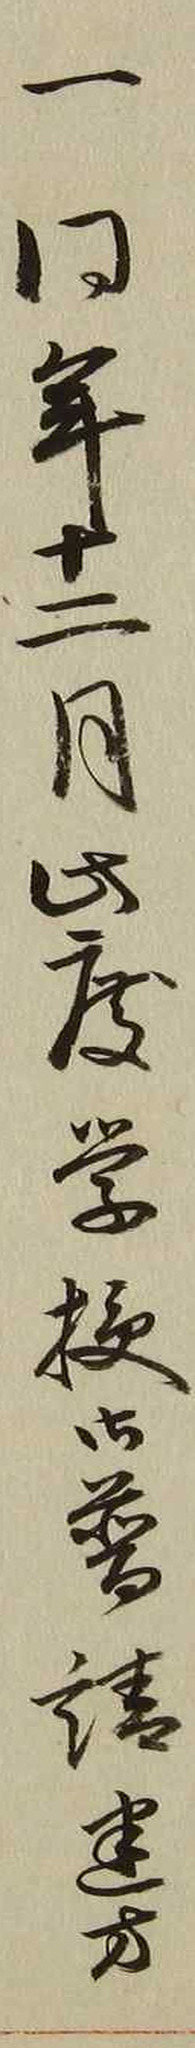一同年十二月此度学校御普請建方
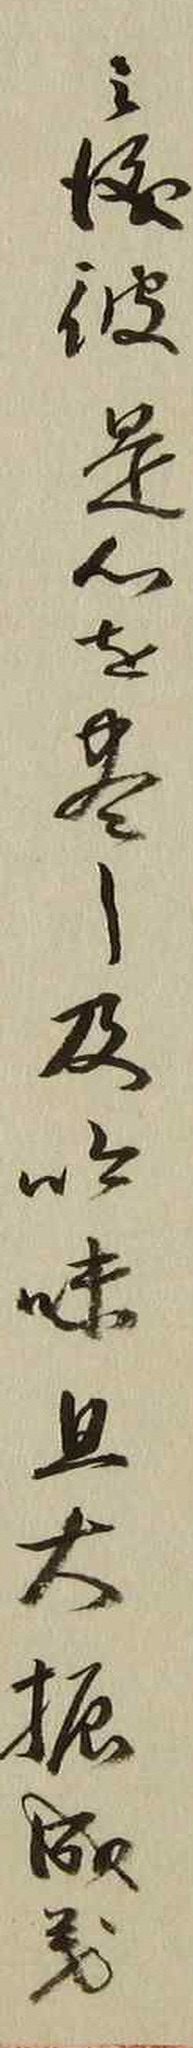之儀彼是心を尽し及吟味且大振成義
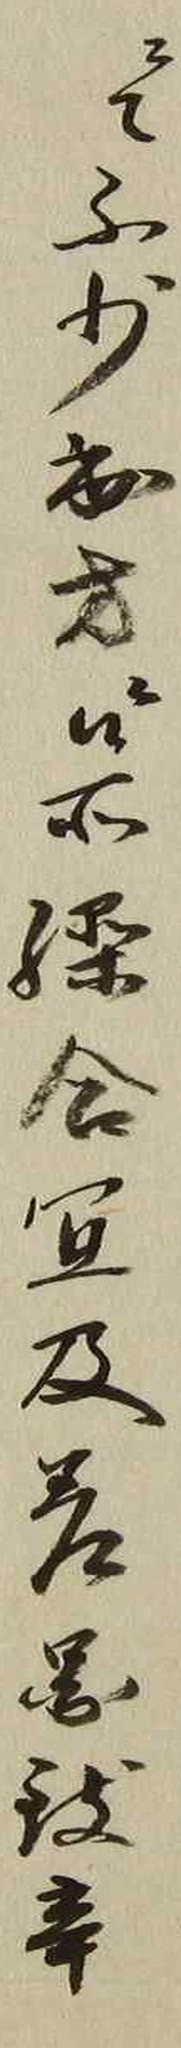にて不少出方に候所繰合宜及指図致辛
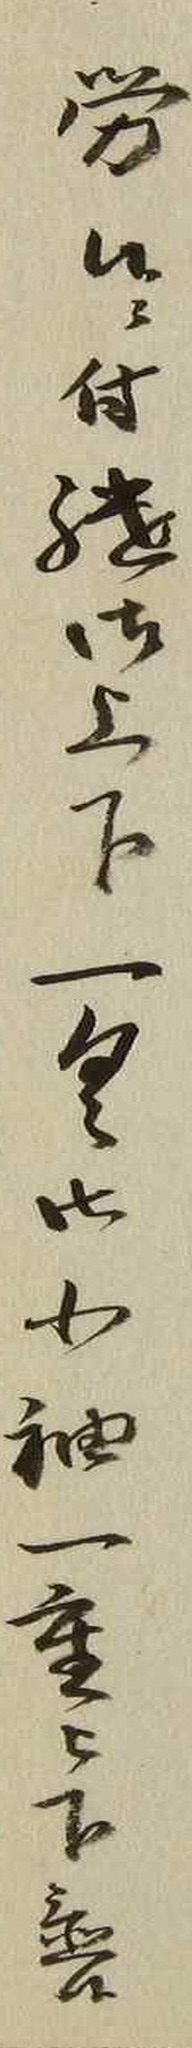労候に付継御上下一具御小袖一重被下置候
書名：諸士系譜　巻之125　た之部1
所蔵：会津若松市立会津図書館
